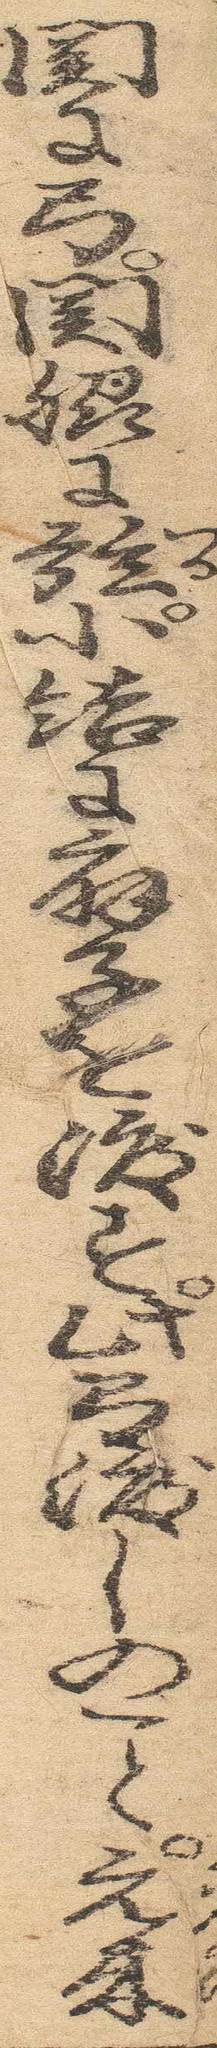関に弓。関脇に弦。小結に扇子を渡す。此弓渡しのこと元来
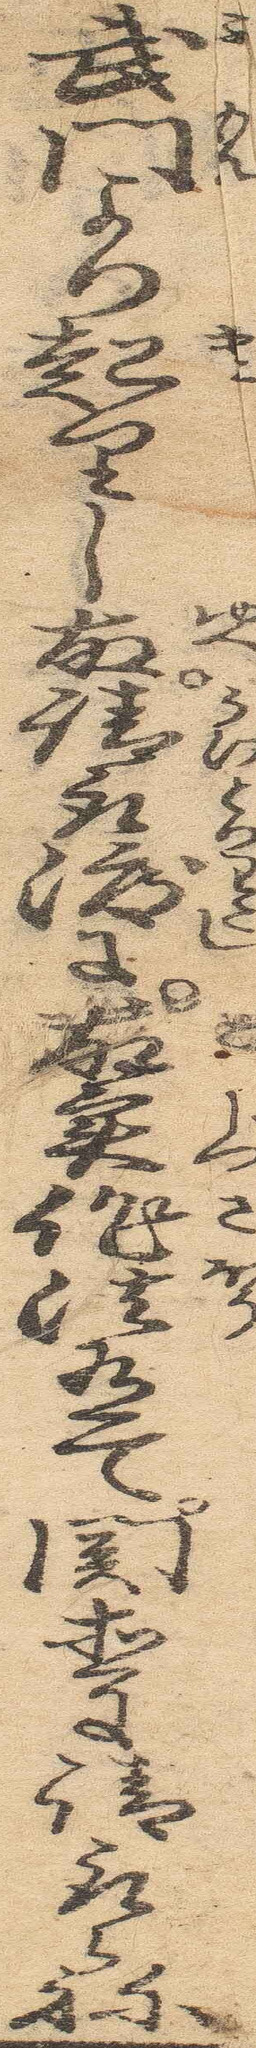武門より起りし故。請取渡に。故実作法有て。関直に請取らね
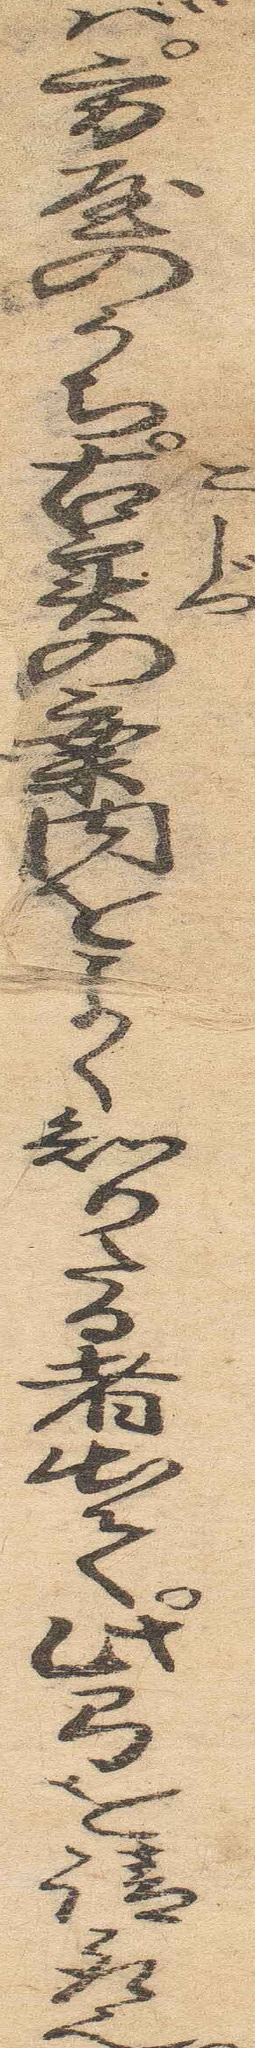バ。方屋のうち。故実の案内をよく知りたる者出て。此弓を請取也。
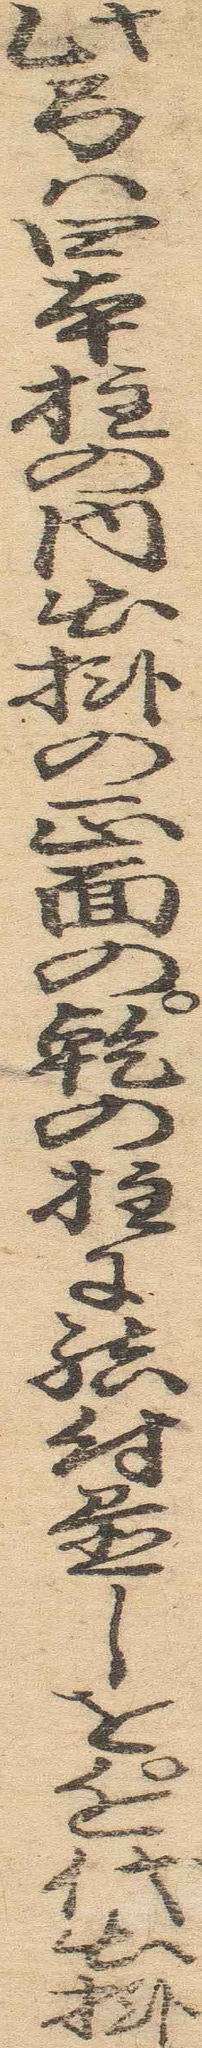此弓ハ四本柱の内出掛の正面の乾の柱に結付置しを。近代出掛
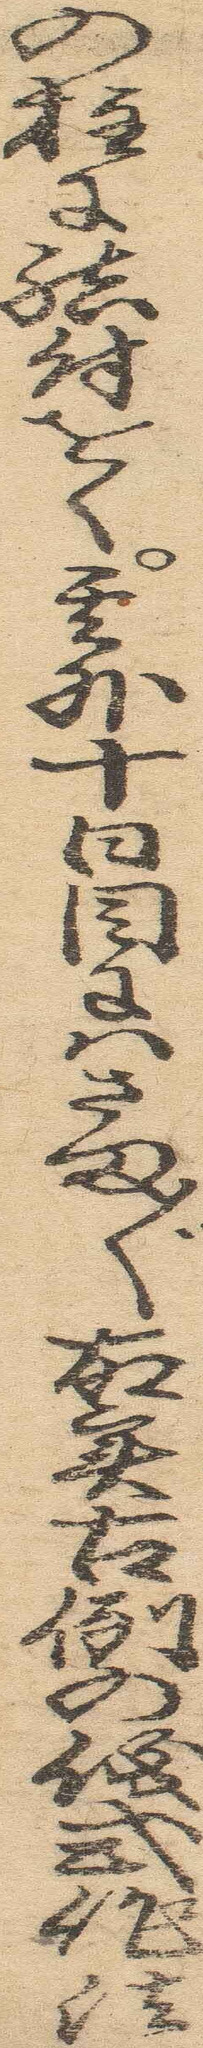の柱に結付をく。其外十日目にハさま〴〵故実古例の儀式作法
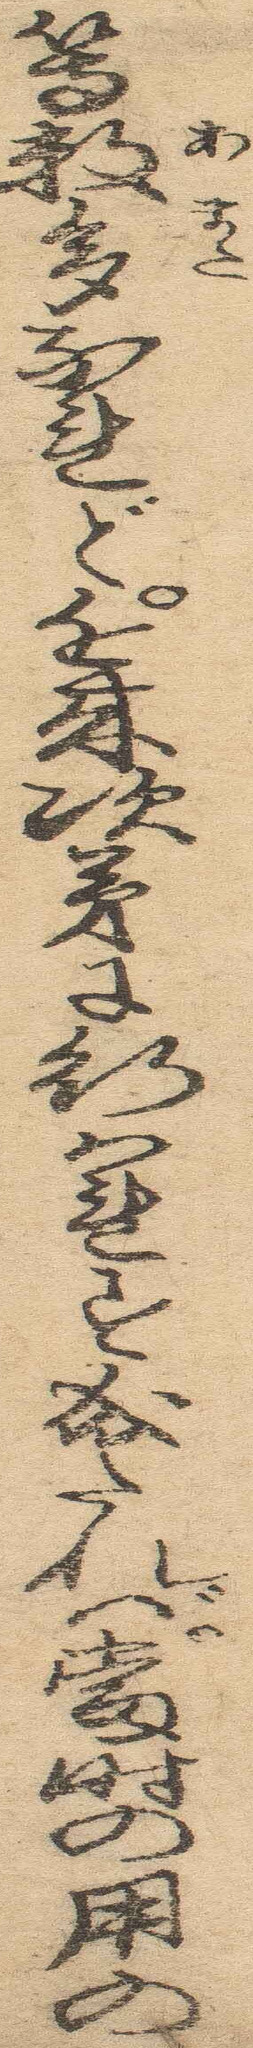等数多なれど。近来次第に行ハれす成たれバ。当時の用の
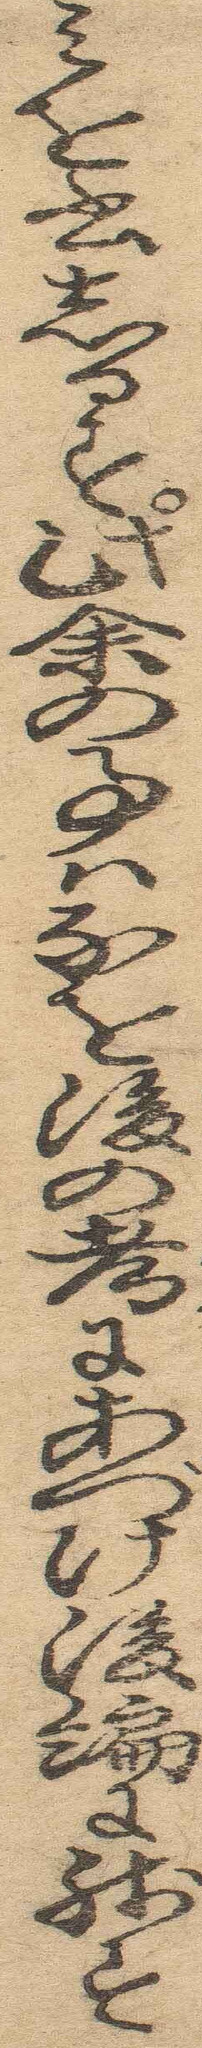ミを書しるす。此余の事ハなを後の考にあづけ後編に残す
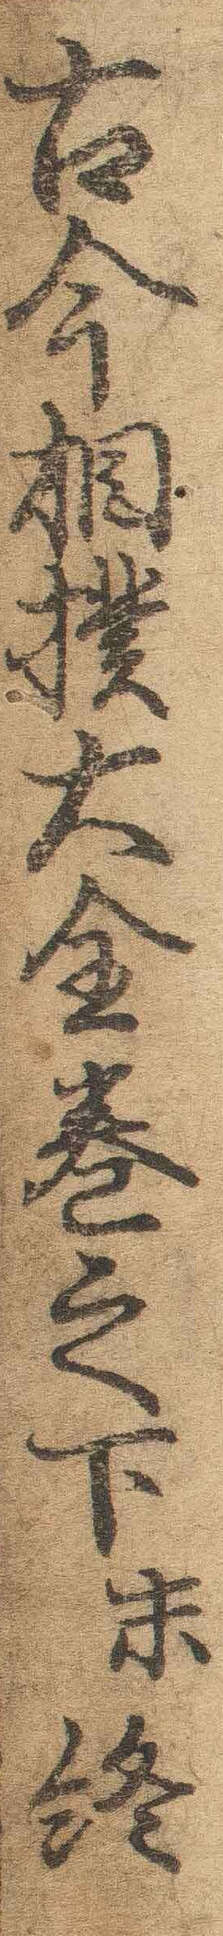古今相撲大全巻之下未終

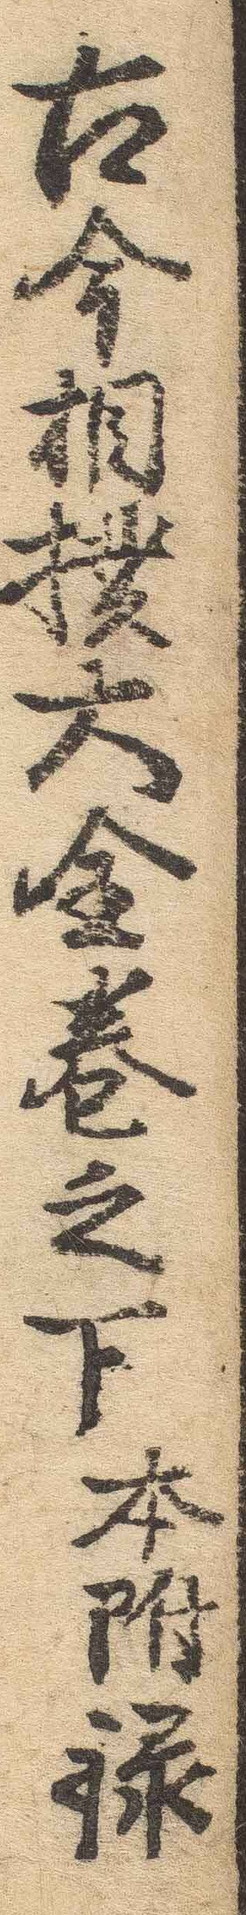古今相撲大全巻之下本附禄
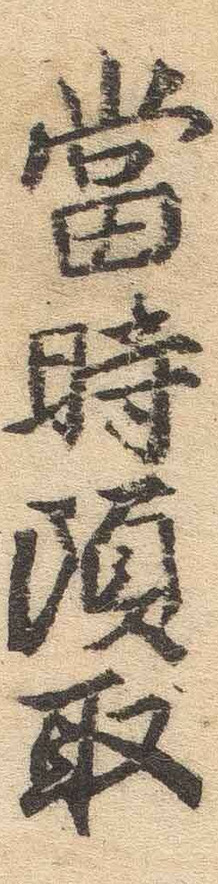当時頭取
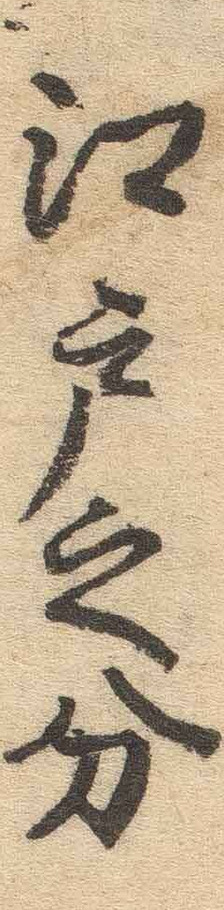江戸之分
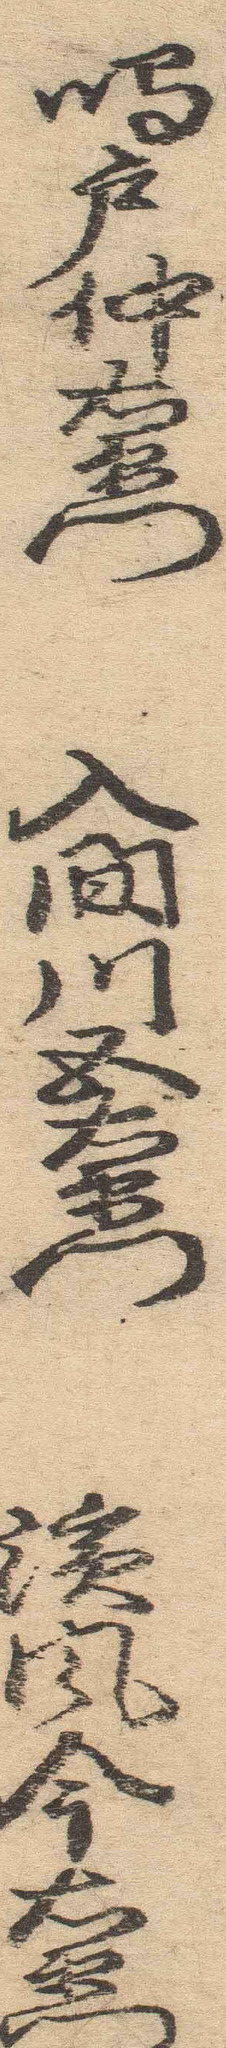鳴戸仲右衛門入間川五右衛門浜風今右衛門
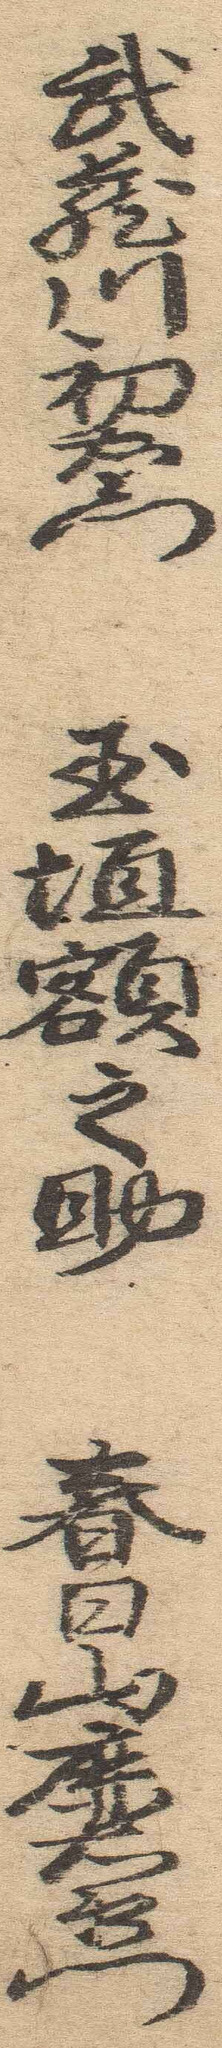武蔵川初右衛門玉垣額之助春日山鹿右衛門
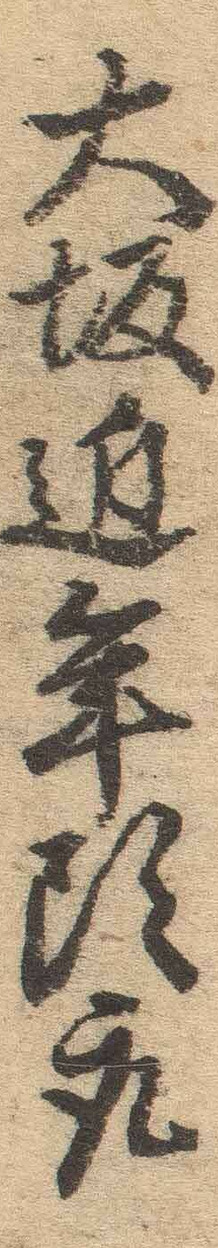大阪近年頭取
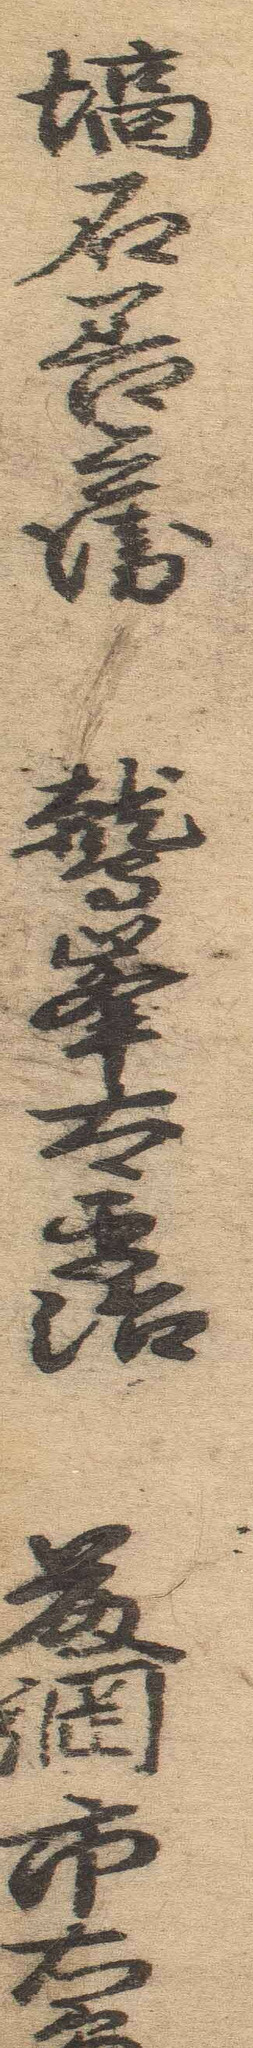塙石善兵衛鷲峯太平治藤綱市右衛門
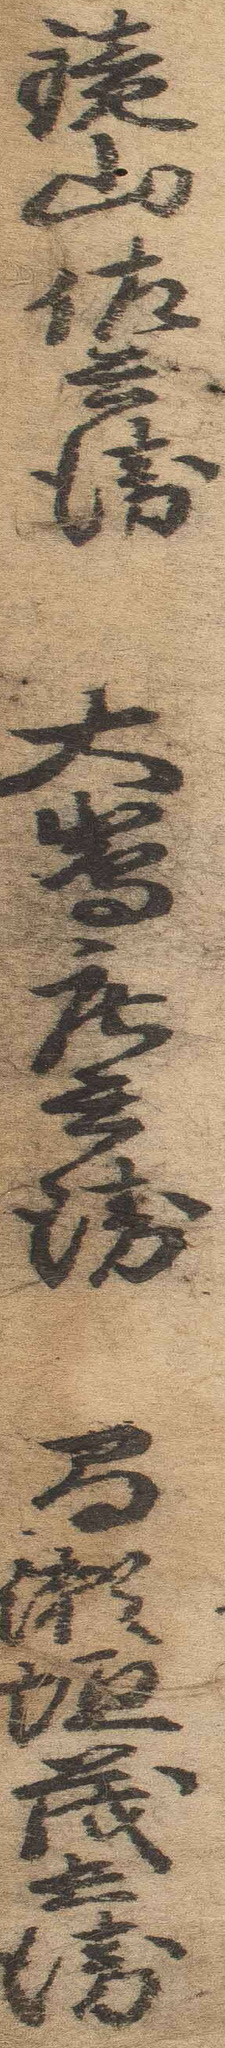鉄山佐兵衛大嶌庄兵衛間瀬垣茂兵衛
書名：古今相撲大全
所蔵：東京学芸大学附属図書館 国文学研究資料館
